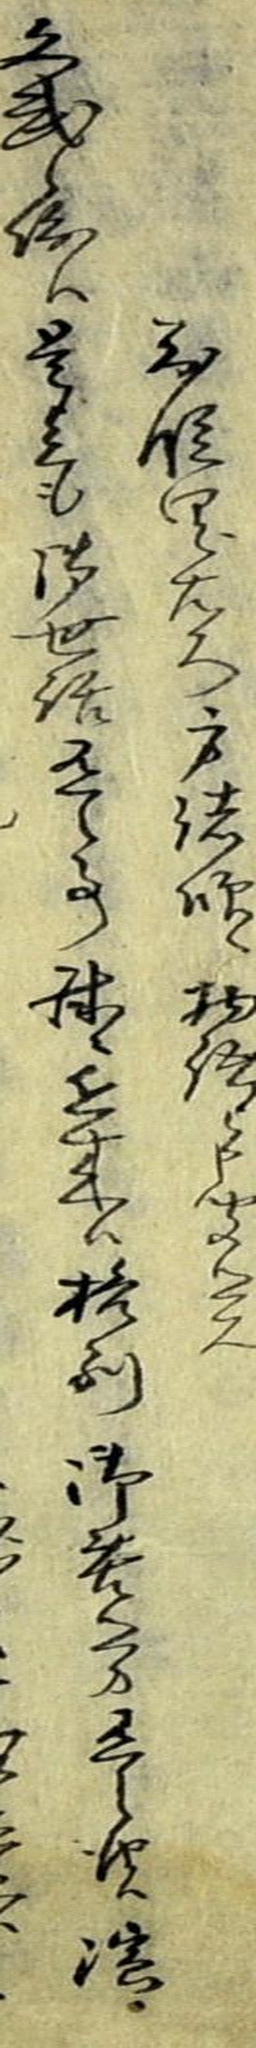文武之儀は是迄も御世話有之事殊に近来は格別御苦労有之儀は演
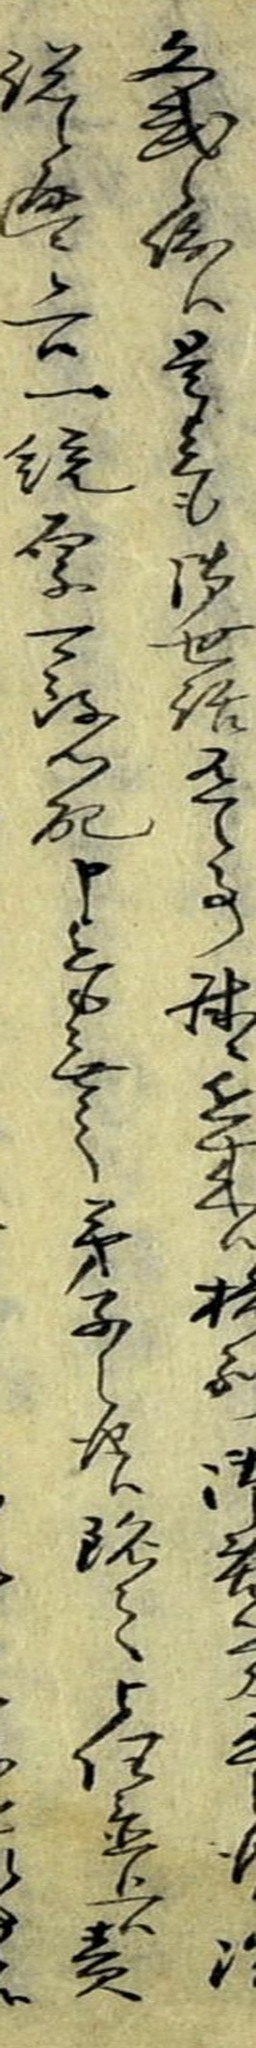説之通に候へは一統厚致心配申迄も無之弟子之儀は銘々へ被任置上は責
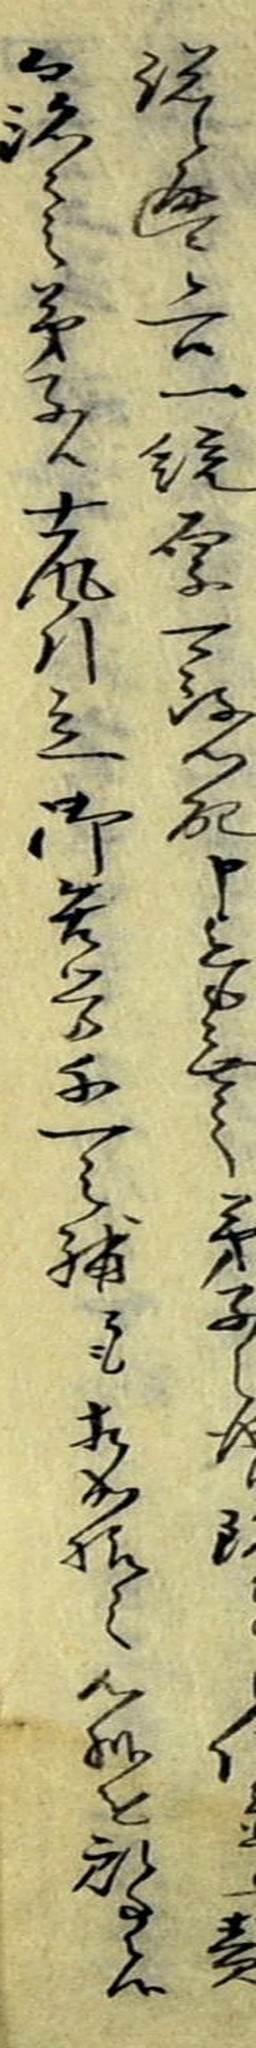而銘々之弟子は古風引立御苦労千一之補にも相成候様之心掛を願事に候

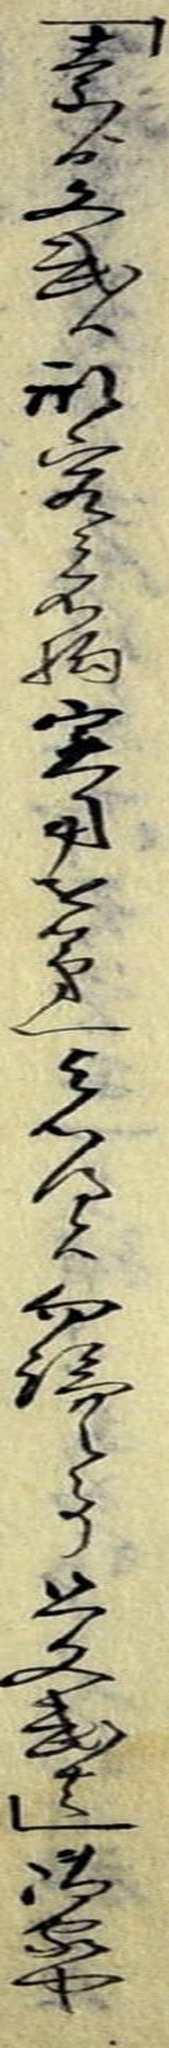「素ゟ文武は形究に不拘実用を第一と心得には勿論之事且又武は」御家中
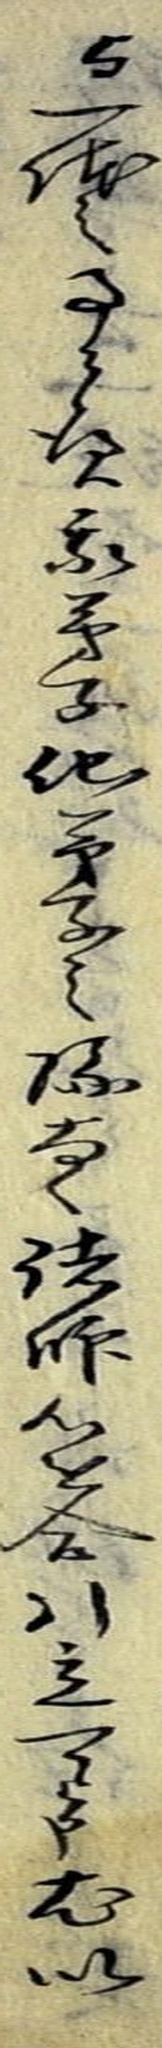と一体之事に候得は我弟子他弟子之際なく諸師心を合引立可被申尤以
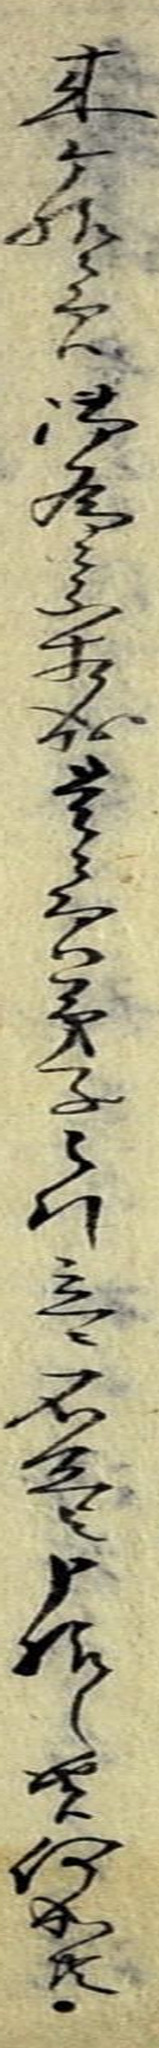來ヶ様に而は御為に不相成是に而は弟子之引立に不宜と申様之儀は何成共
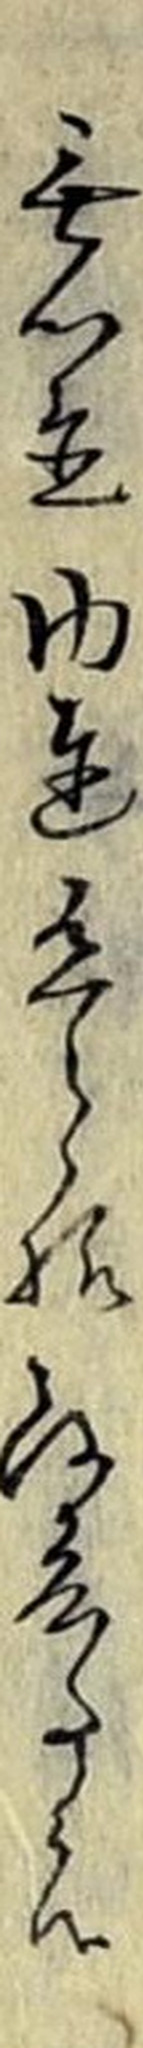無心置内達有之候様致度事に候
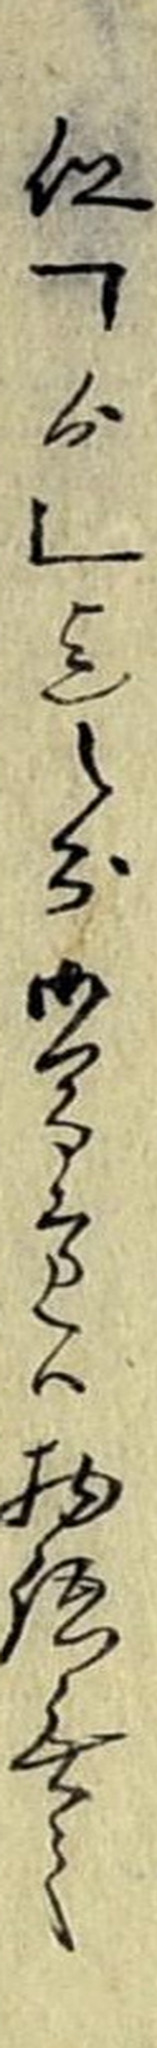但「ゟ」迄之分御馬方へは物語無之
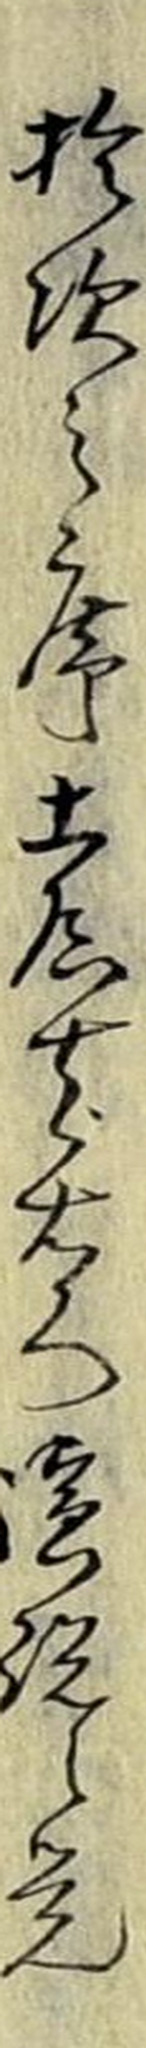於次之席土屋十郎右衛門演説之覚
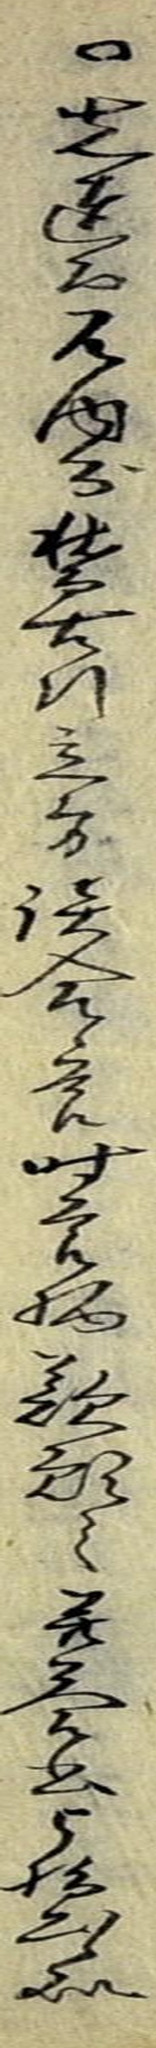○先達而乍内分稽古引立方談合之節時節柄歎願之并答書被指出候処
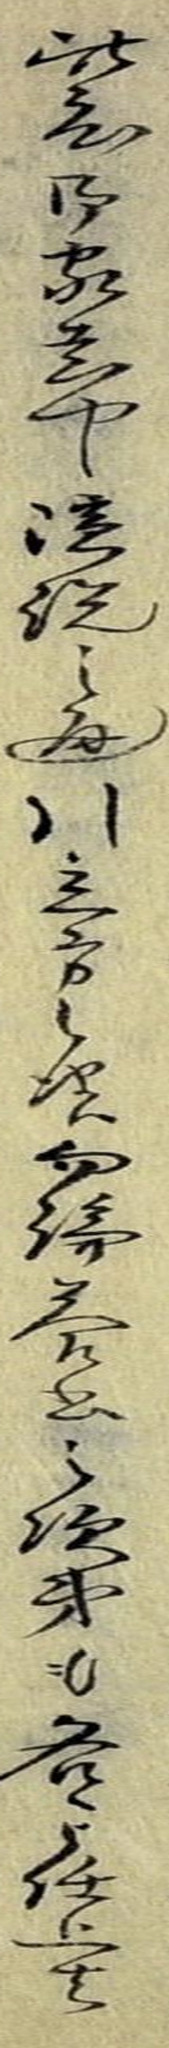此度御家老中演説之通引立方之儀は勿論答書之次第も各へ被任上は
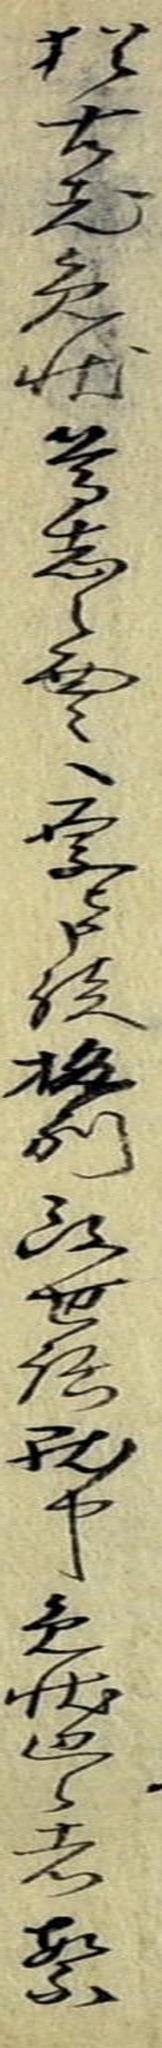猶古老免状篤志之面々へ厚被申談格別致世話就中免状辺之者察
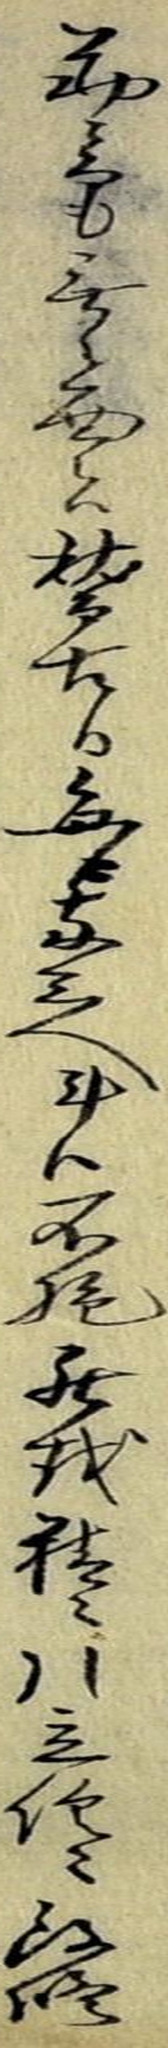勤に而も無之面々は稽古日毎日両三人斗は不絶罷越精々引立倶々致修
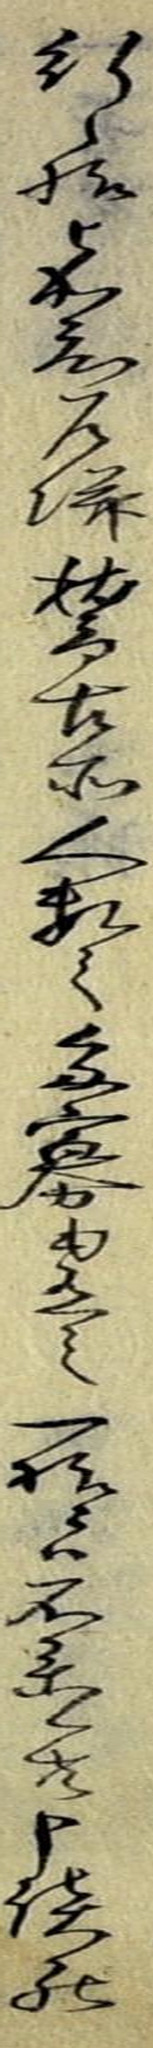行候様被成度乍併稽古所人数之多寡も有之一様には不参候共申談罷
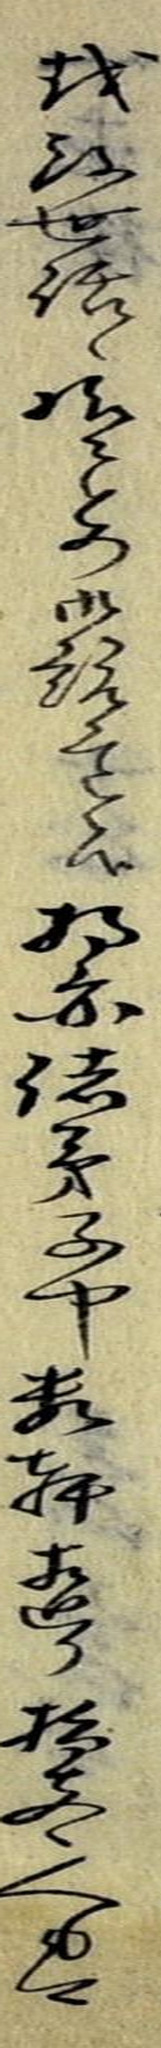越致世話候様にとの御趣意に候猶亦諸弟子中数軒相廻り指支候人も可
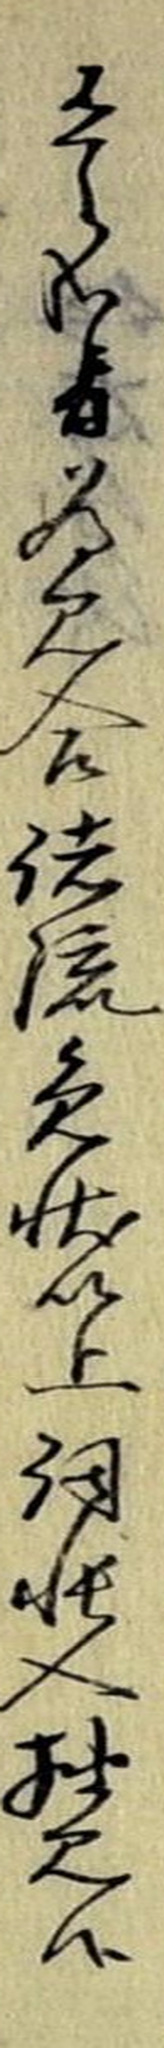有之哉に付為見合諸流免状以上調帳入披見候
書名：命令之部 六
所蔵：福井県文書館 Fukui Prefectural Archives
